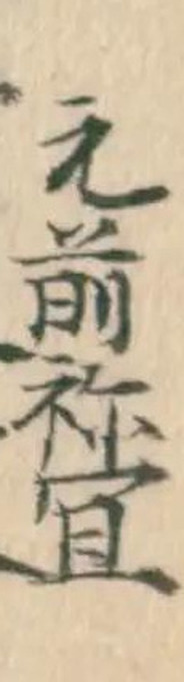元前祢宜
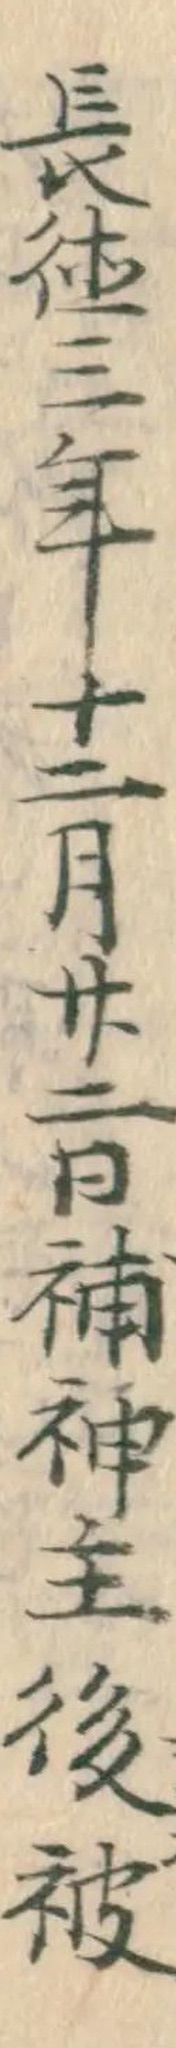長徳三年十二月廿二日補神主後被
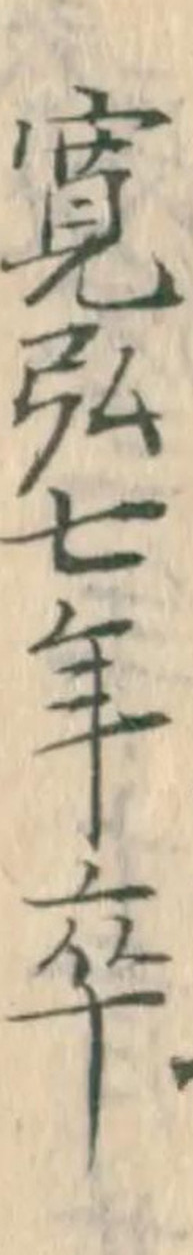寛弘七年卒
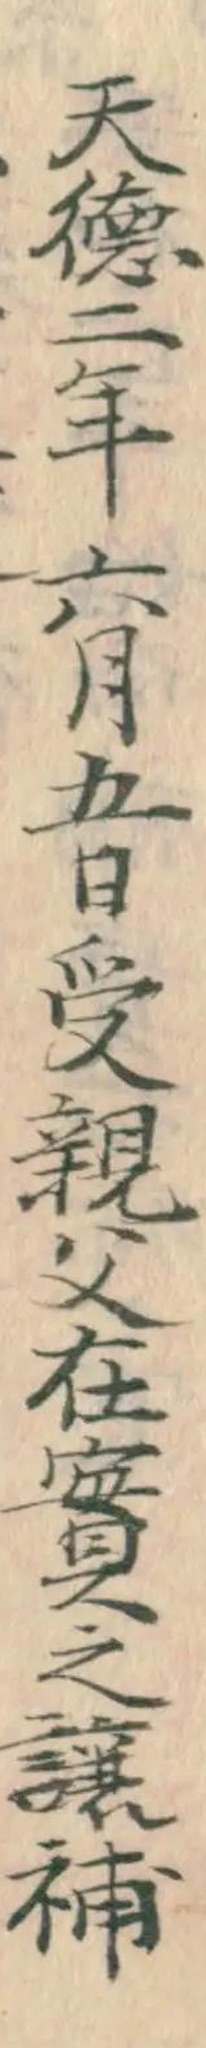忠成天徳二年六月五日受親父在實之譲補

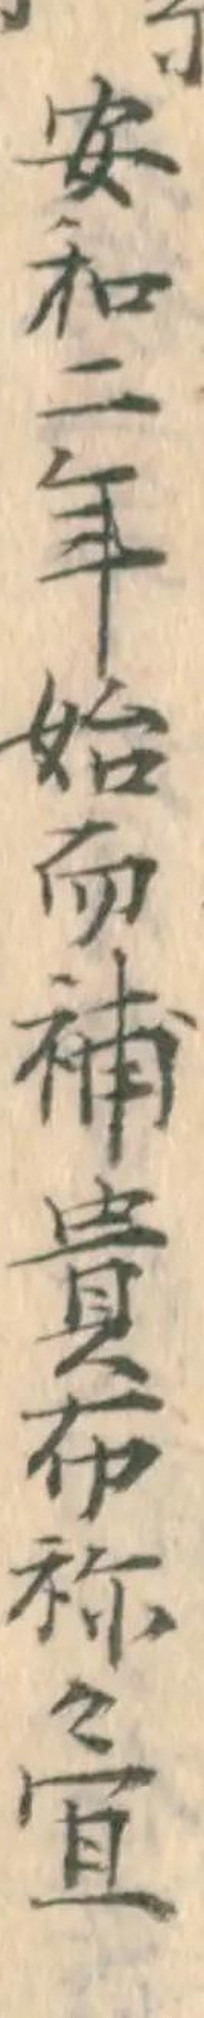安和二年始而補貴布祢々宜
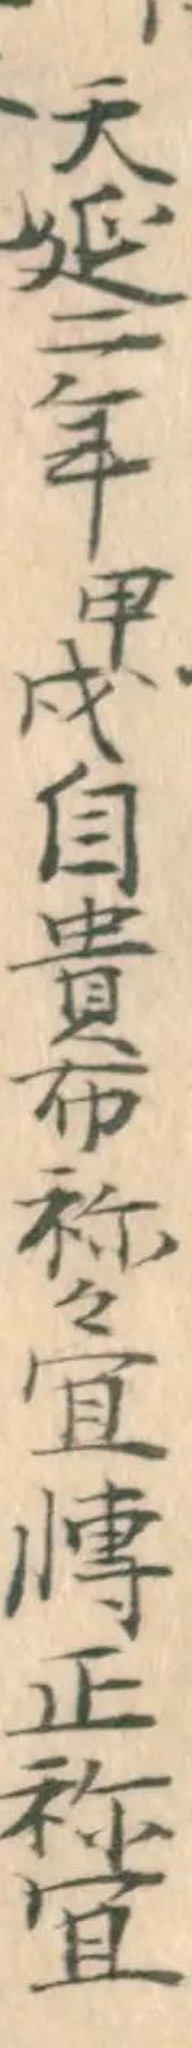天延二年甲戌自貴布祢々宜転正祢宜
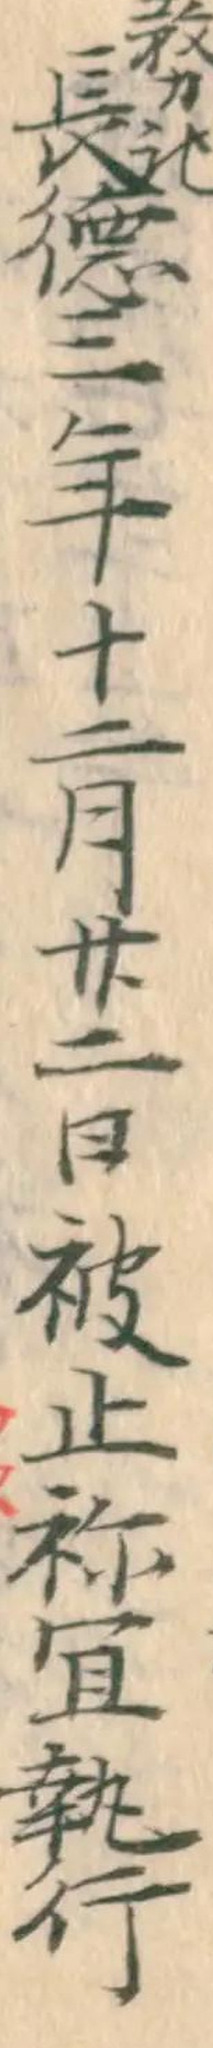長徳三年十二月廿二日被止祢宜執行
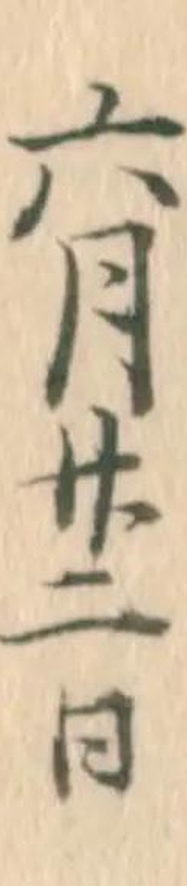六月廿二日
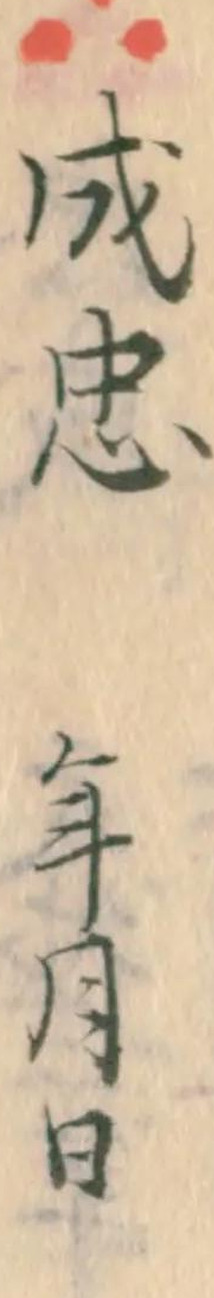成忠年月日
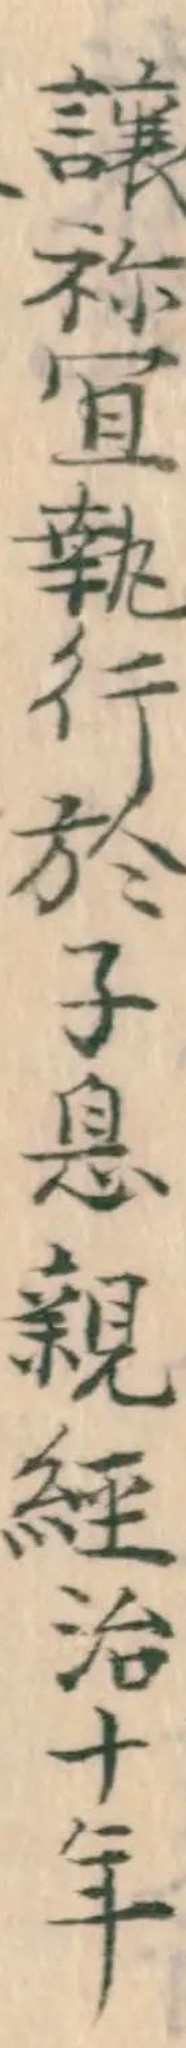譲祢宜執行於子息親経治十年
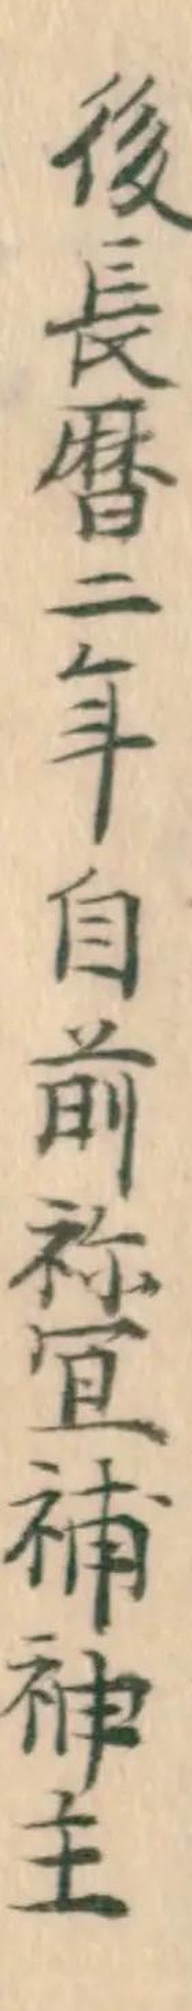後長暦二年自前祢宜補神主
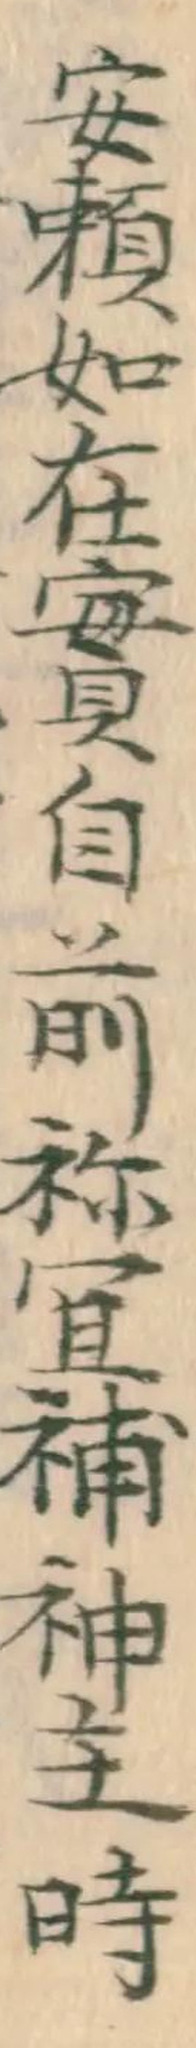安頼如在実自前祢宜補神主時
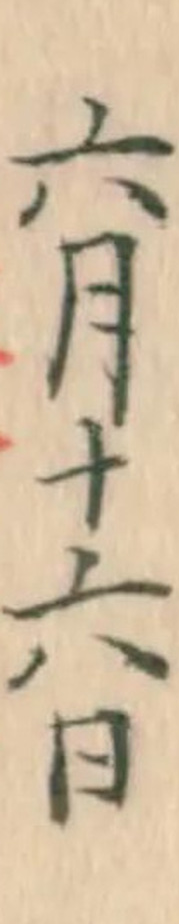六月廿二日
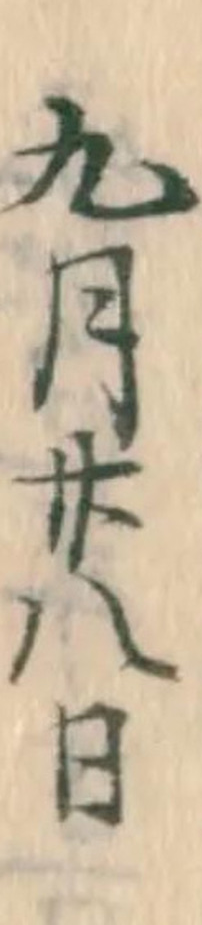六月廿二日
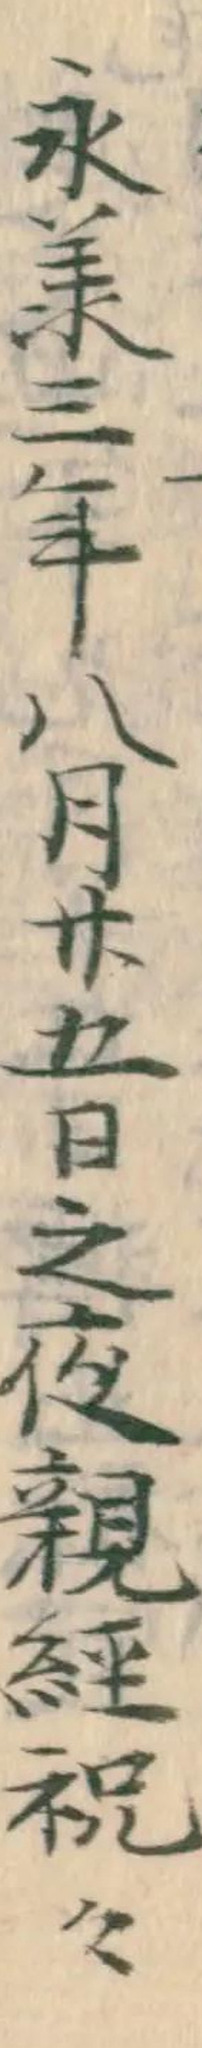永承三年八月廿五日之夜親経祝々
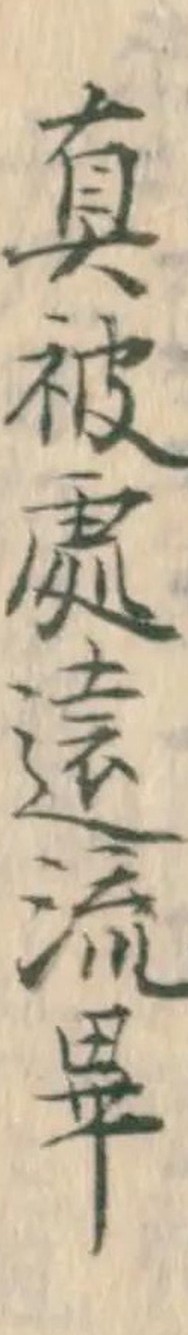真被処遠流畢
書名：賀茂社記録. 第23冊
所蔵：国立国会図書館 National Diet Library, JAPAN
